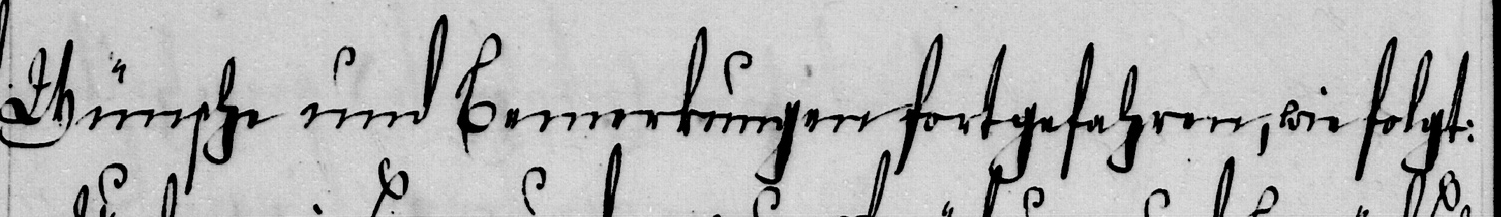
Wünsche und Bemerkungen fortgefahren, wie folgt:
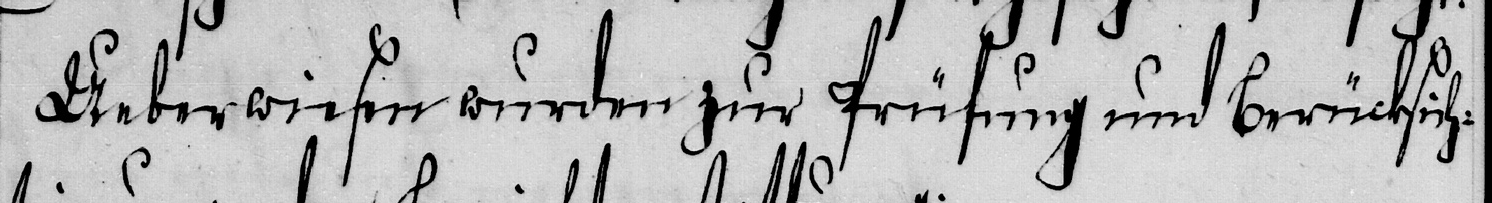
Ueberwiesen wurde zur Prüfung und Berücksich¬
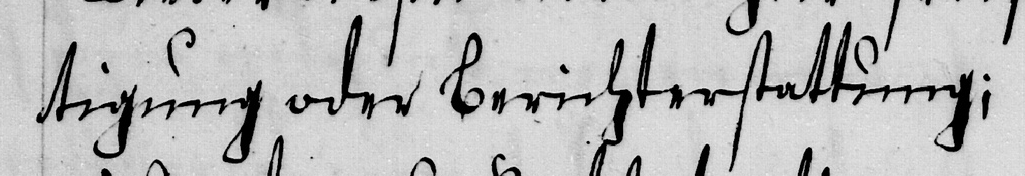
tigung oder Berichterstattung;
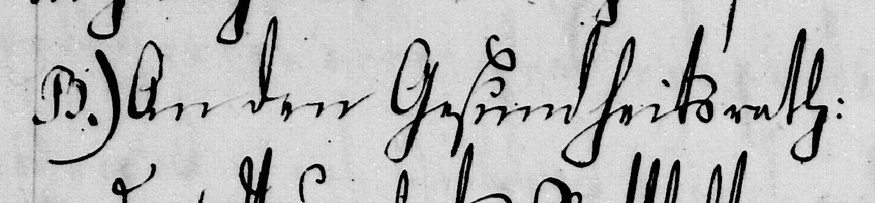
B.) An den Gesundheitsrath:
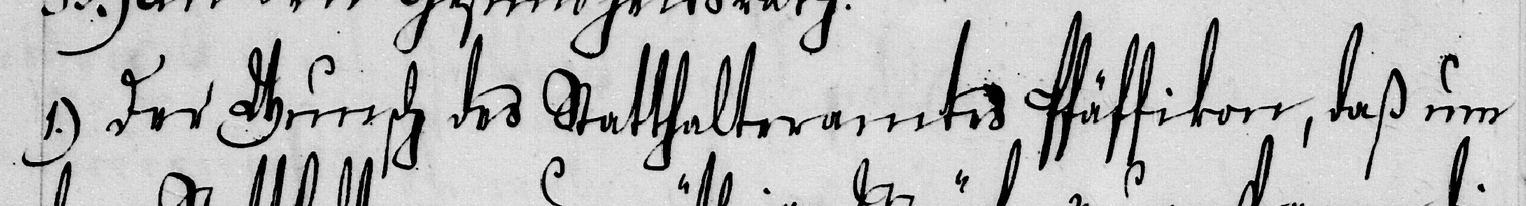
1.) Der Wunsch des Statthalteramtes Pfäffikon, daß um
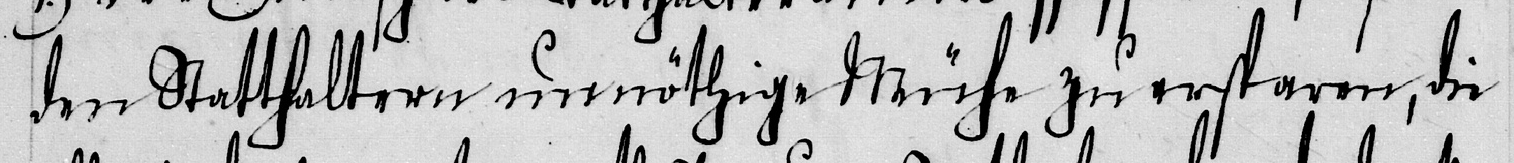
den Statthaltern unnöthige Mühe zu ersparen, die
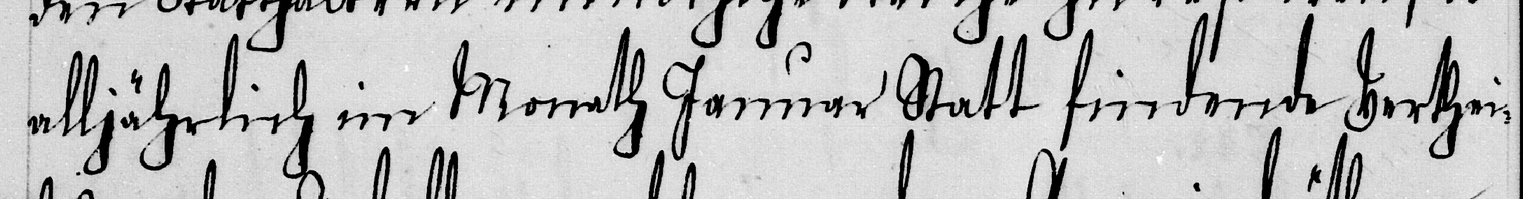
alljährlich im Monath Januar Statt findende Verthe¬
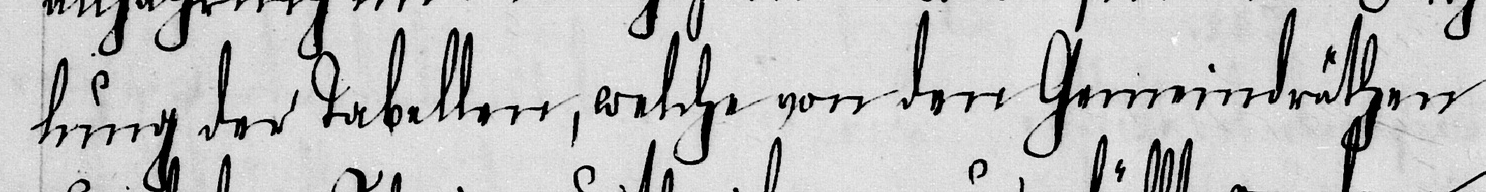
ilung der Tabellen, welche von den Gemeindräthen
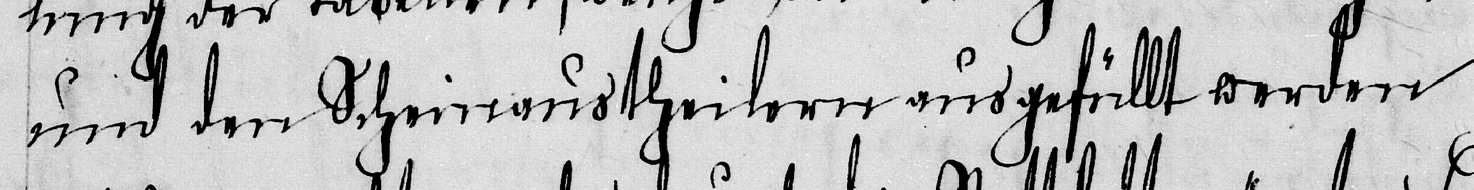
und den Scheinaustheilern ausgefüllt werden
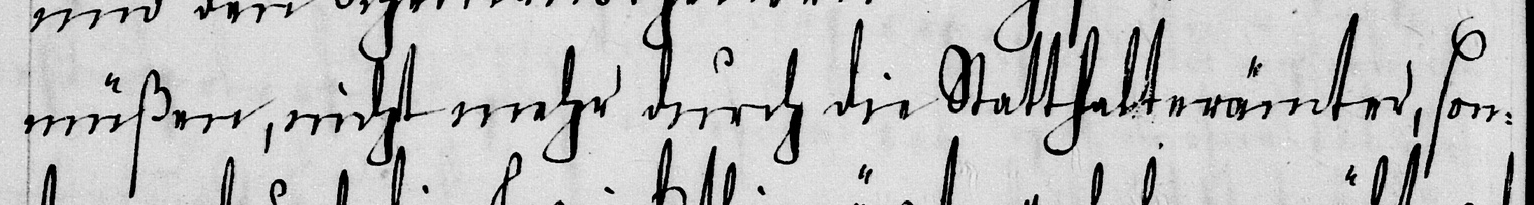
müßen, nicht mehr durch die Statthalterämter, son¬
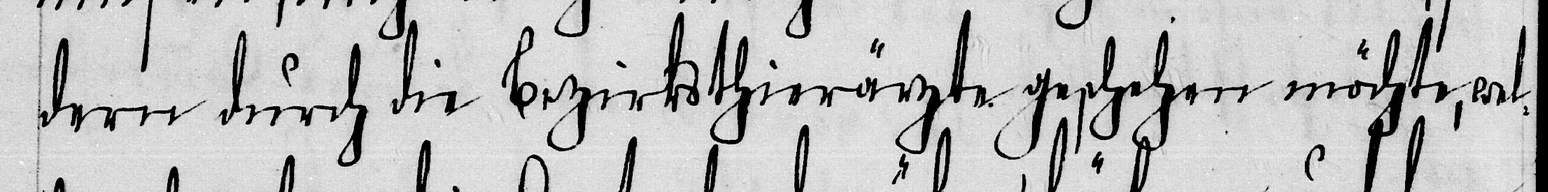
dern durch die Bezirksthierärzte geschehen möchte, we¬
